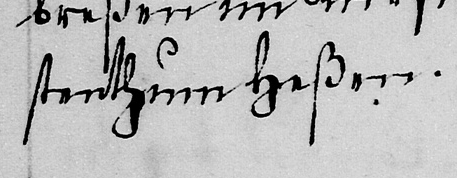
stenthum Heßen,
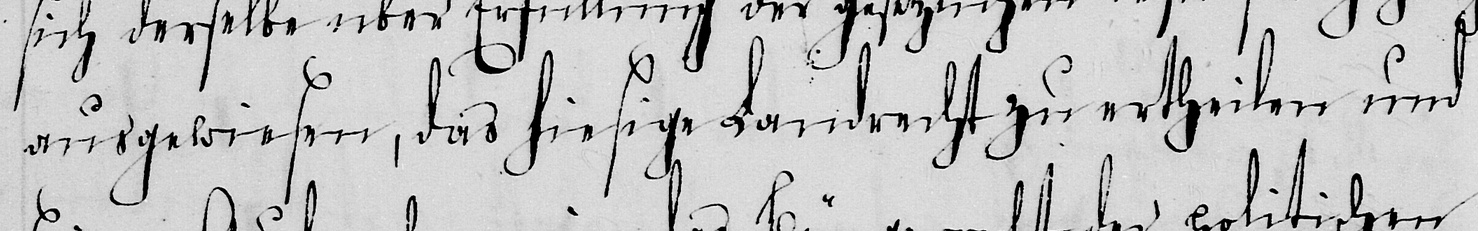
ausgewiesen, das hiesige Landrecht zu ertheilen und
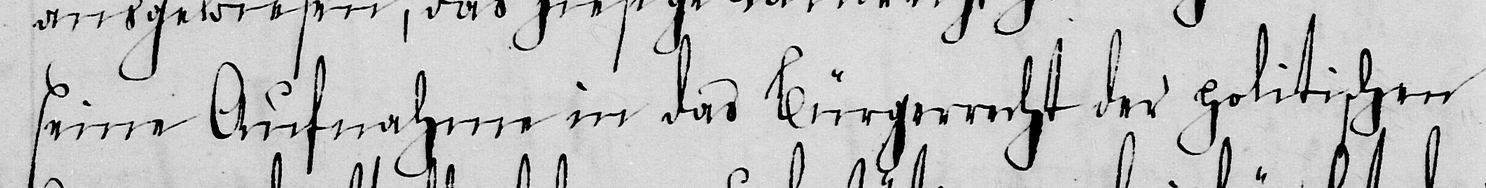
seine Aufnahme in das Bürgerrecht der politischen
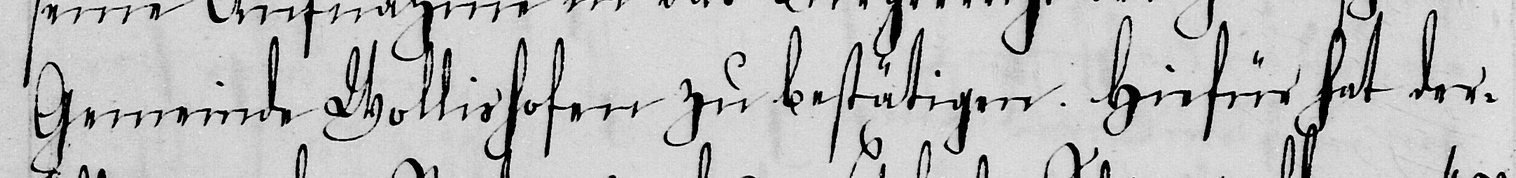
Gemeinde Wollishofen zu bestätigen. Hiefür hat der¬
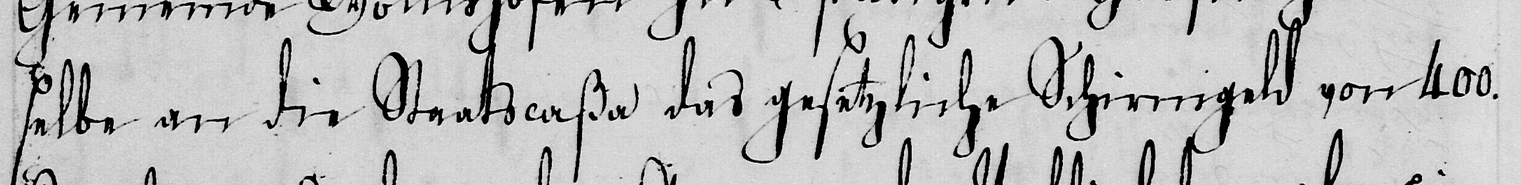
selbe an die Staatscaßa das gesetzliche Schirmgeld von 400.
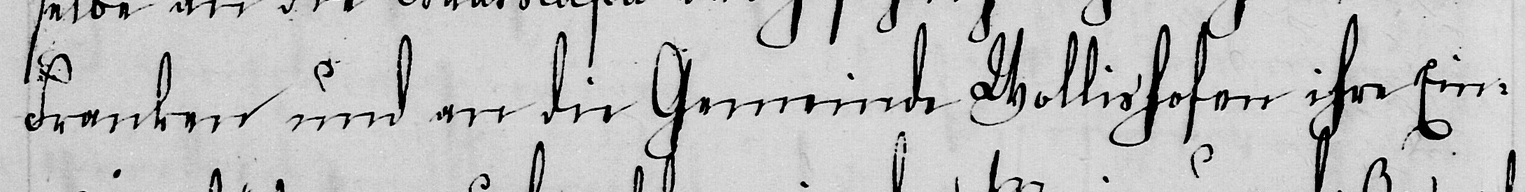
Franken und an die Gemeinde Wollishofen ihre Ein¬
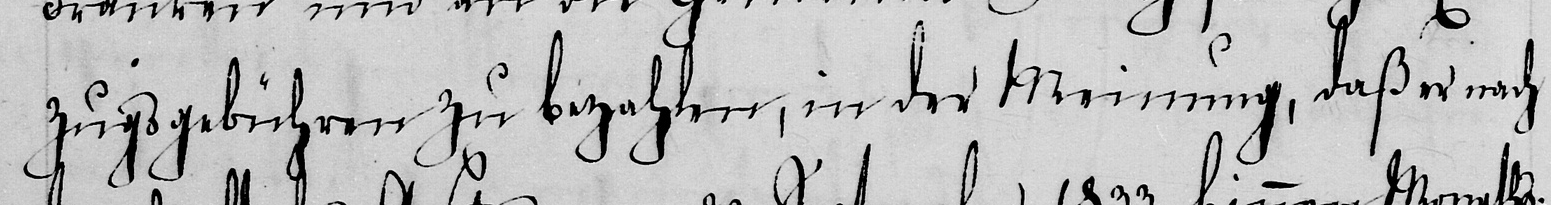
zugsgebühren zu bezahlen, in der Meinung, daß er nach
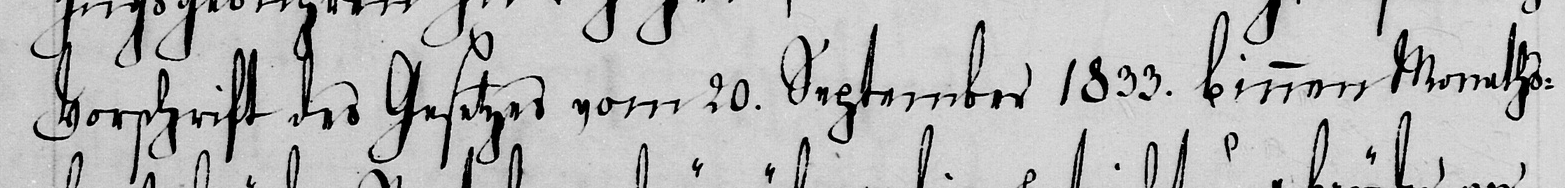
Vorschrift des Gesetzes vom 20. September 1833. binnen Monaths¬
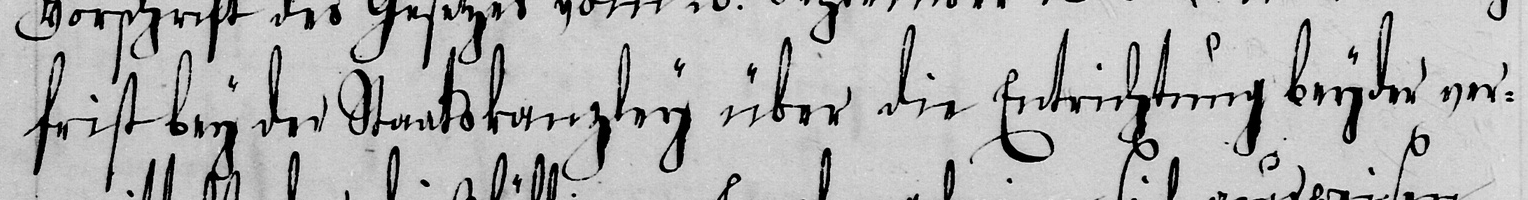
frist bey der Staatskanzley über die Eintrichtung beyder er¬
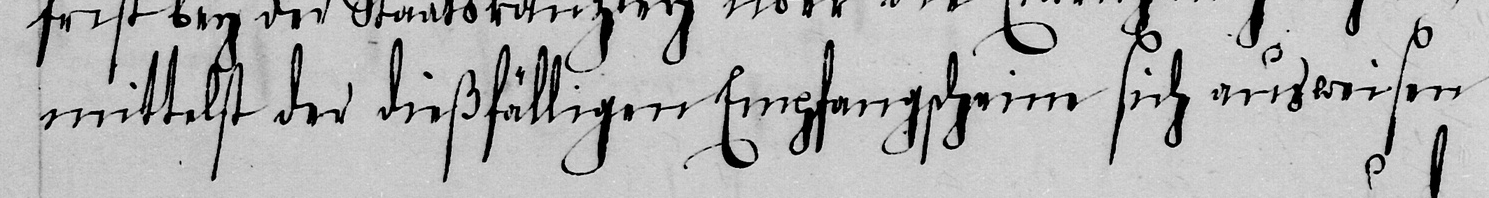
mittelst der dießfälligen Empfangscheine sich ausweisen
